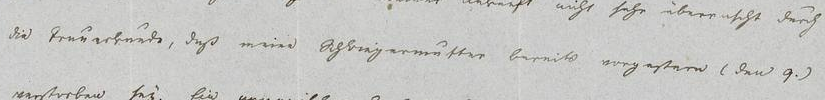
die Trauerkunde, daß meine Schwiegermutter bereits vorgestern (den 9.)
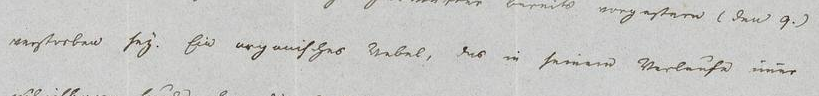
verstorben sey. Ein organisches Uebel, das in seinem Verlaufe immer
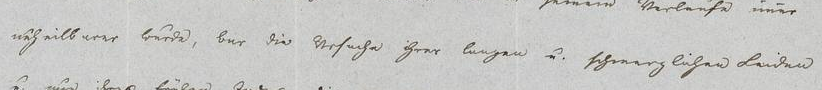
unheilbarer wurde, war die Ursache ihrer langen u. schmerzlichen Leiden
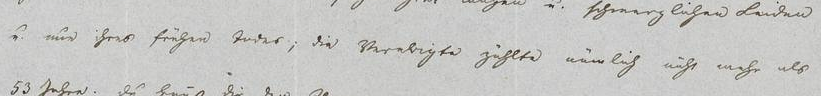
u. nun ihres frühen Todes; die Verewigte zählte nämlich nicht mehr als
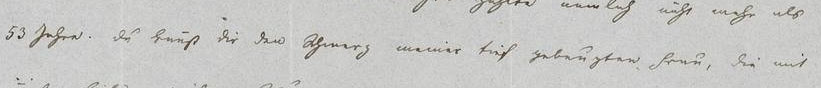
53 Jahre. Du kannst Dir den Schmerz meiner tief gebeugten Frau, die mit
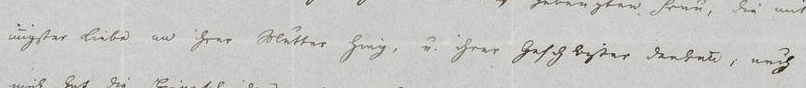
innigster Liebe an ihrer Mutter hing, u. ihrer Geschwister denken; auch
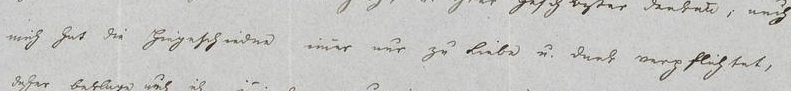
mich hat die Hingeschiedne immer nur zu Liebe u. Dank verpflichtet,
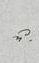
u.
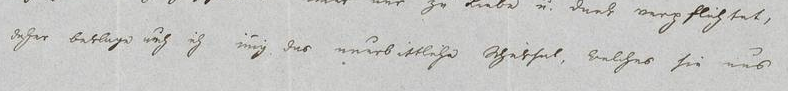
daher beklage auch ich innig das unerbittliche Schicksal, welches sie uns
